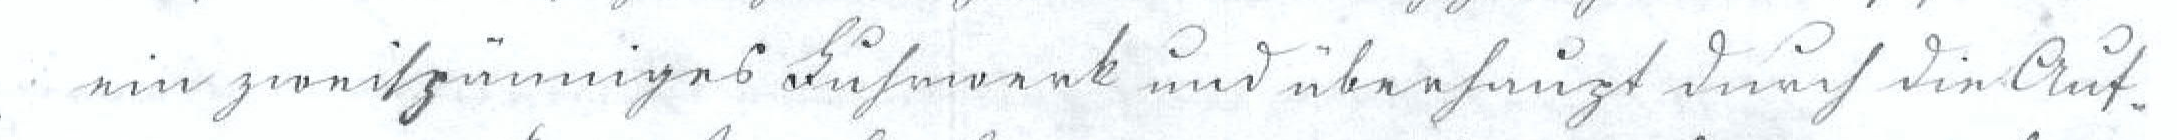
ein zweispänniges Fuhrwerk und überhaupt durch die Auf¬
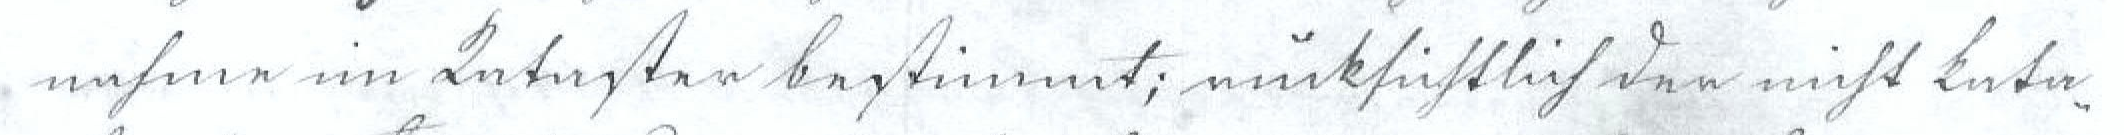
nahme im Kataster bestimmt; rücksichtlich der nicht kata¬
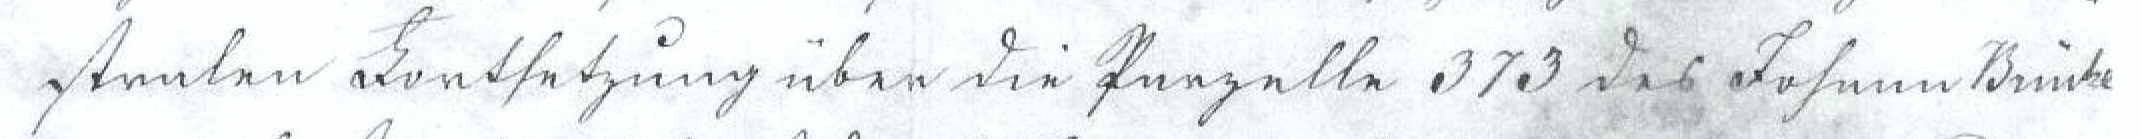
stralen Fortsetzung über die Parzelle 373 des Johann Brückl
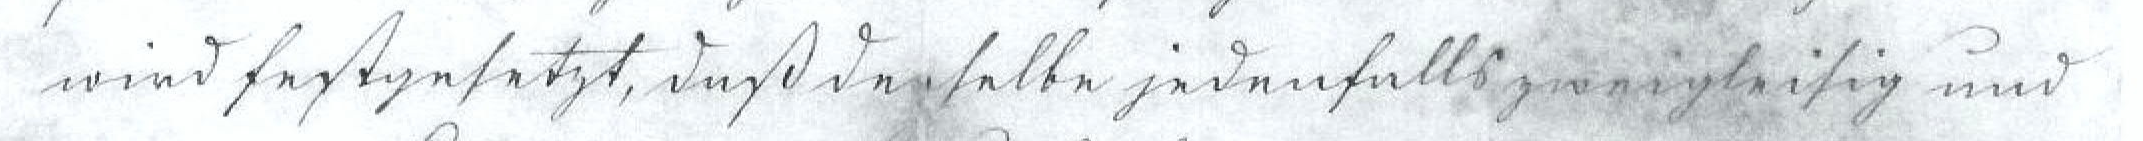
wird festgesetzt, dass derselbe jedenfalls zweigleisig und
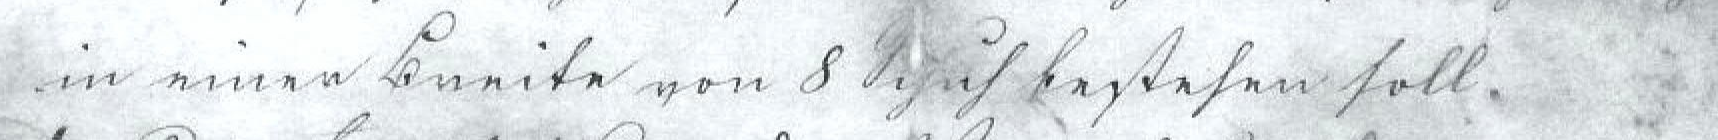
in einer Breite von 8 Schuh bestehen soll.
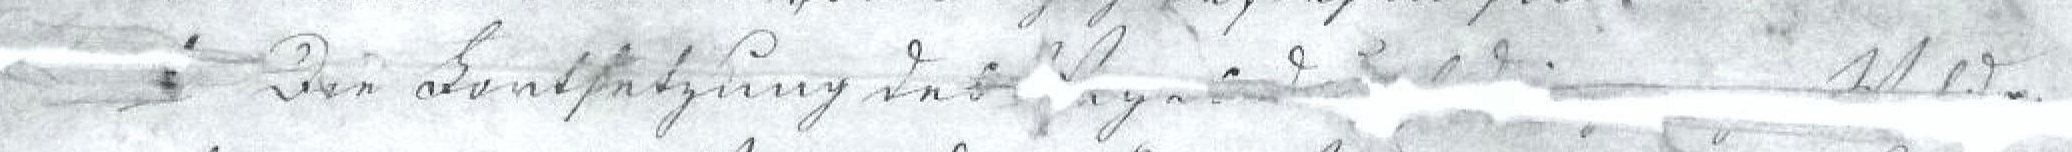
d Die Fortsetzung des
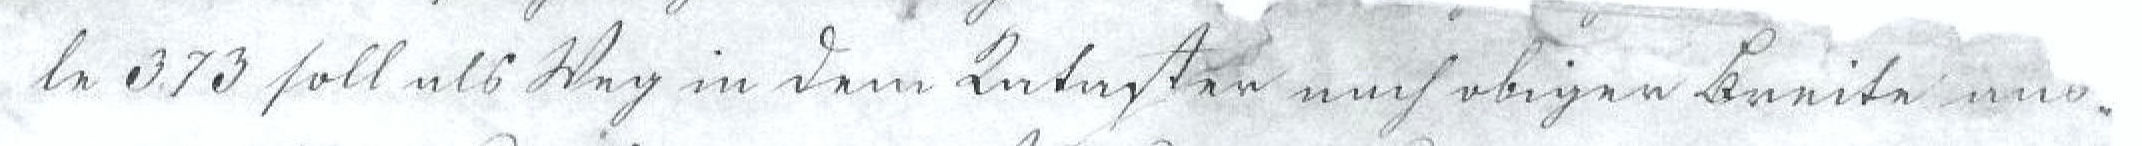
le 373 soll als Weg in dem Kataster nach obiger Breite aus¬
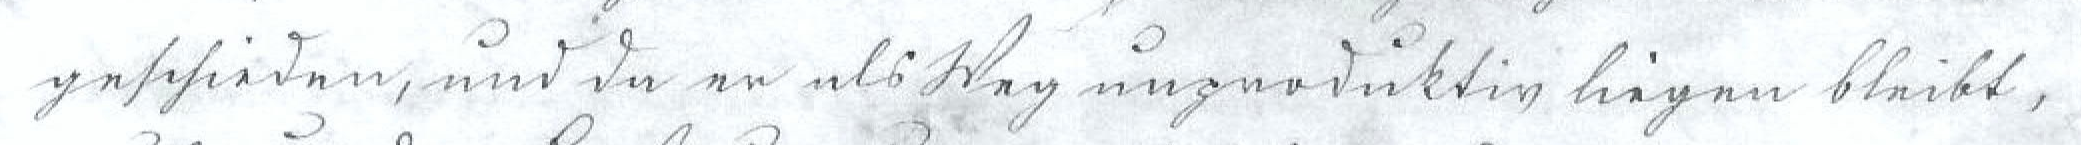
geschieden, und da er als Weg unproduktiv liegen bleibt,
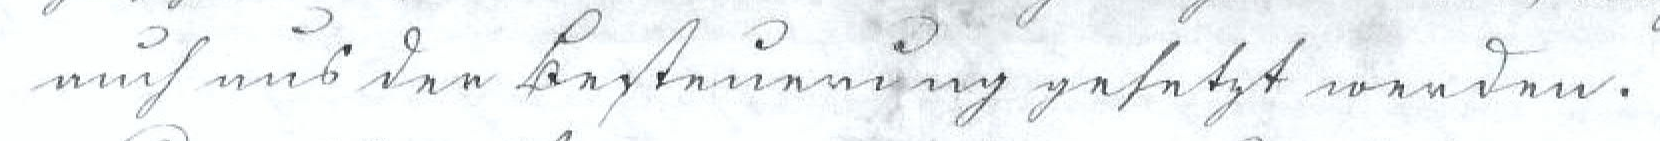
auch aus der Besteuerung gesetzt werden.
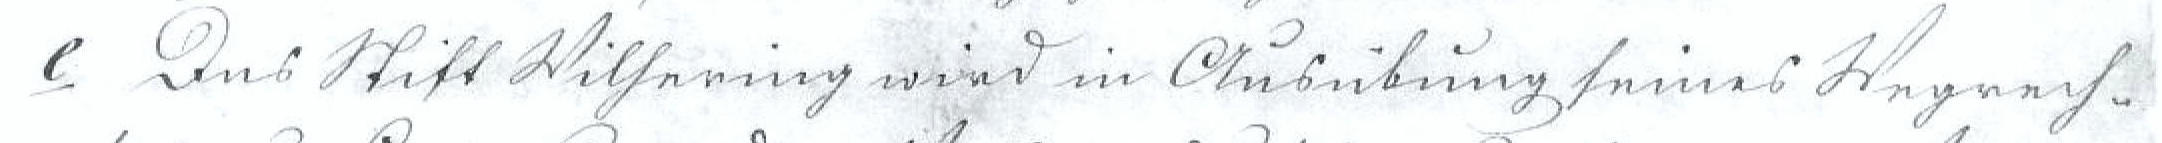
e Das Stift Wilhering wird in Ausübung seines Wegrech¬
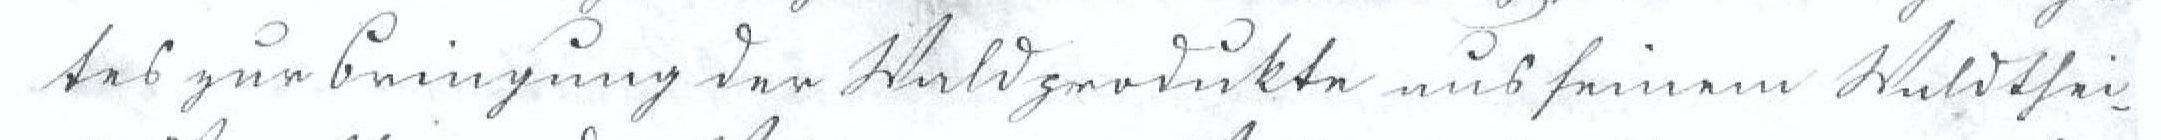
tes zur Bringung der Waldprodukte aus seinem Waldthei¬
